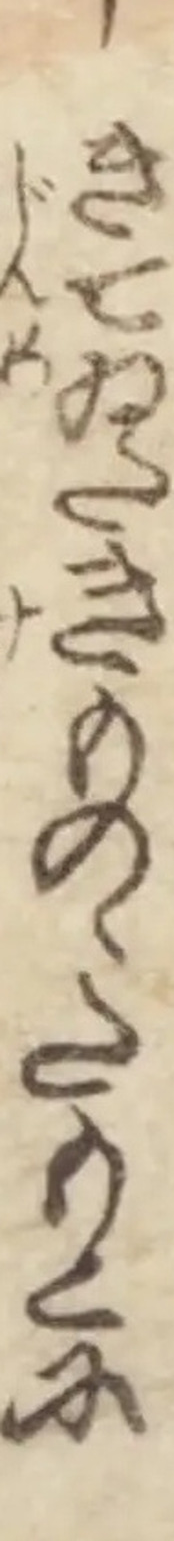きてゐたきものゝたもとに
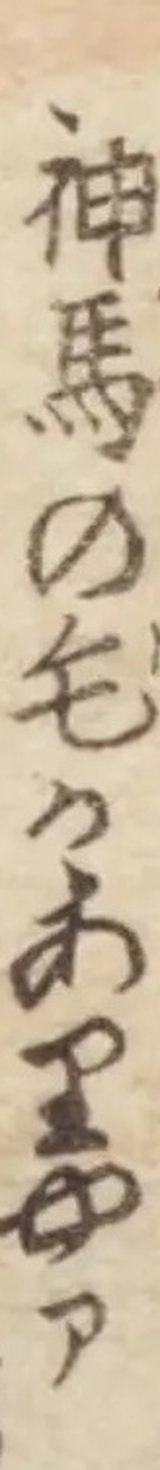神馬の毛がありやア
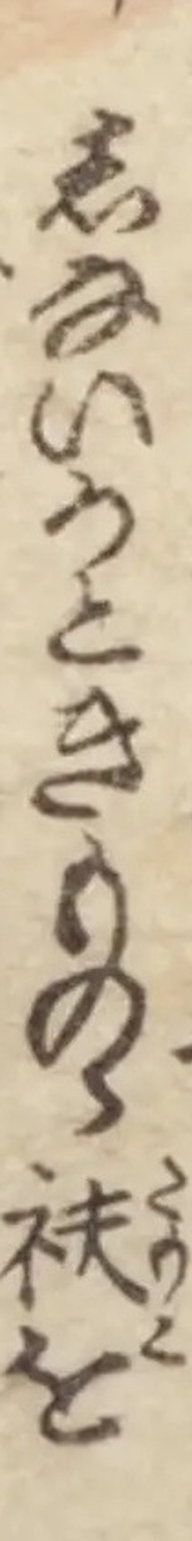しないかときものゝ袂を
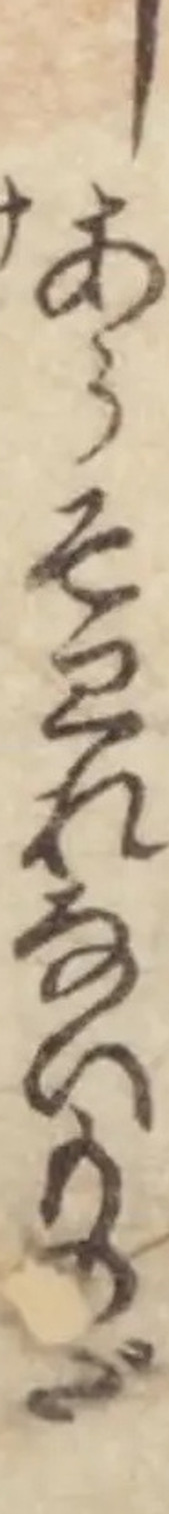あらそわれないものだ
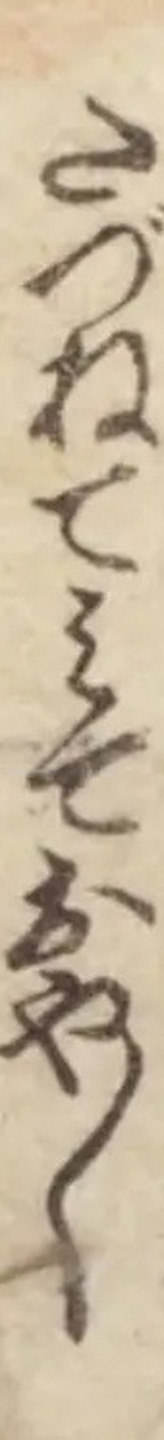たづねてみておや〳〵
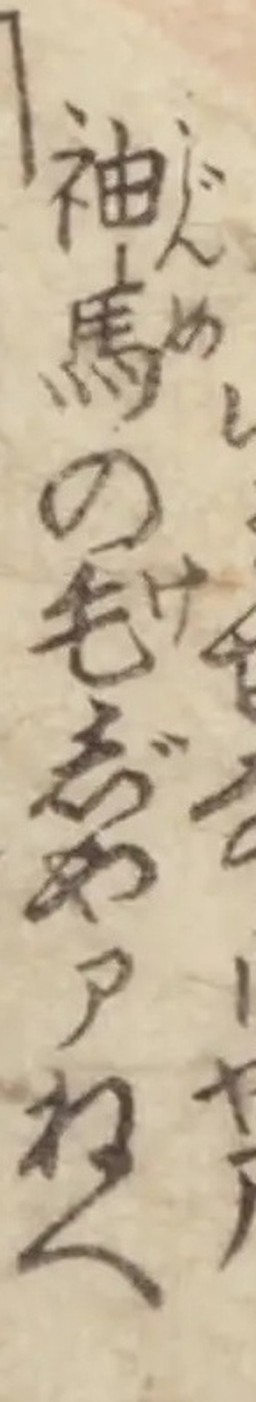神馬の毛じやアねへ
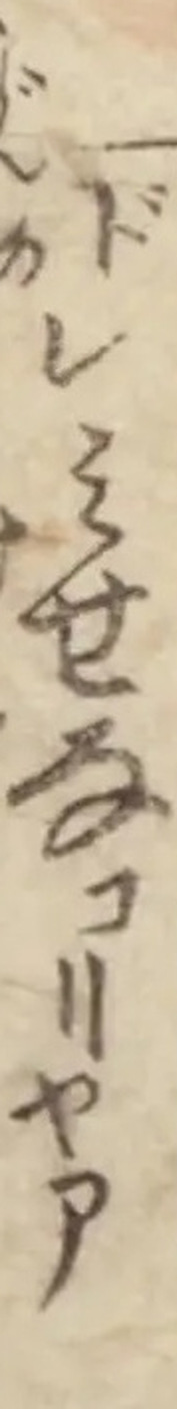「ドレみせなコリヤア
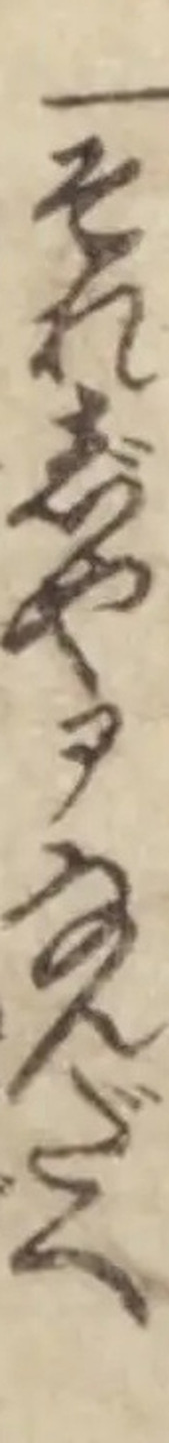「それじやアなんだへ
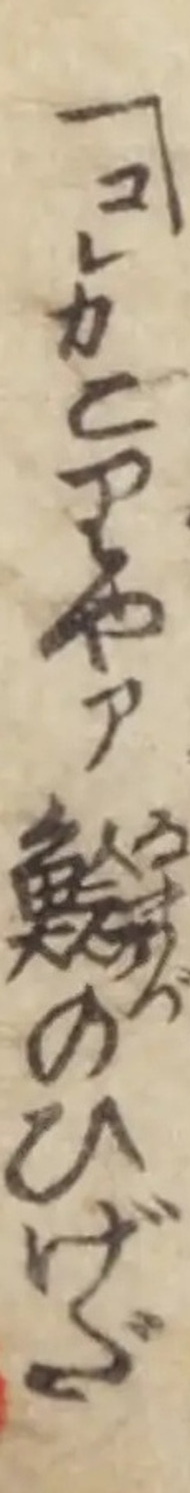「コレカこりやア鯰のひげだ
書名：二日はなし地震亭念魚町々庵炎上
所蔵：国立国会図書館 National Diet Library, JAPAN
